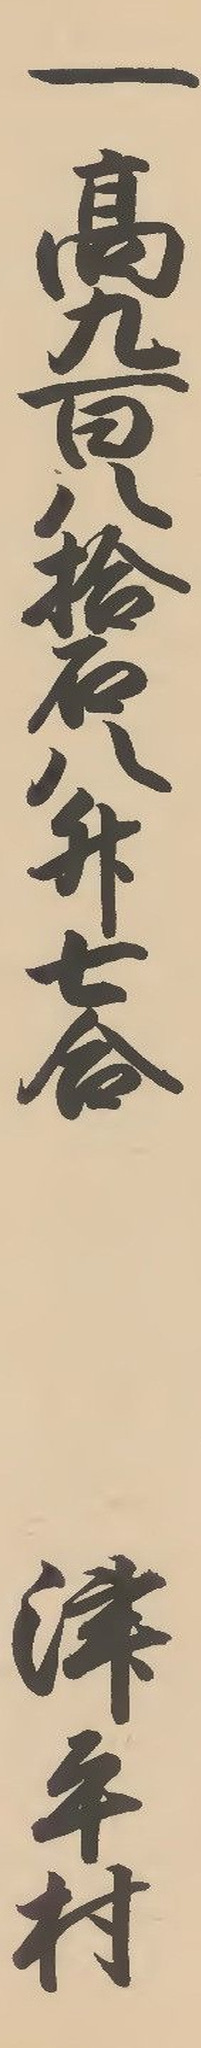一高九百八拾石八升七合津平村
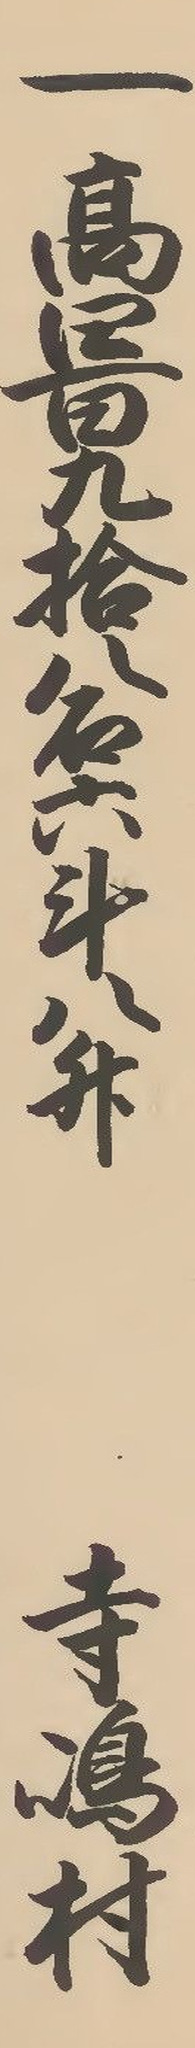一高四百九拾八石六斗八升寺島村
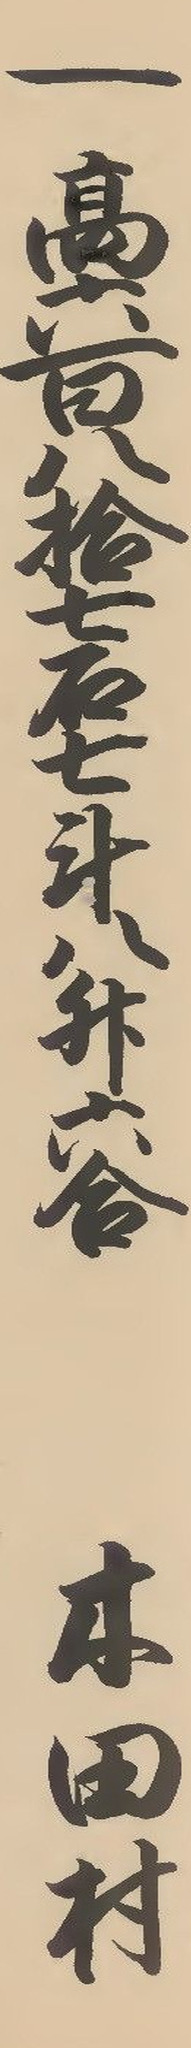一高六百八拾七石七斗八升六合木田村
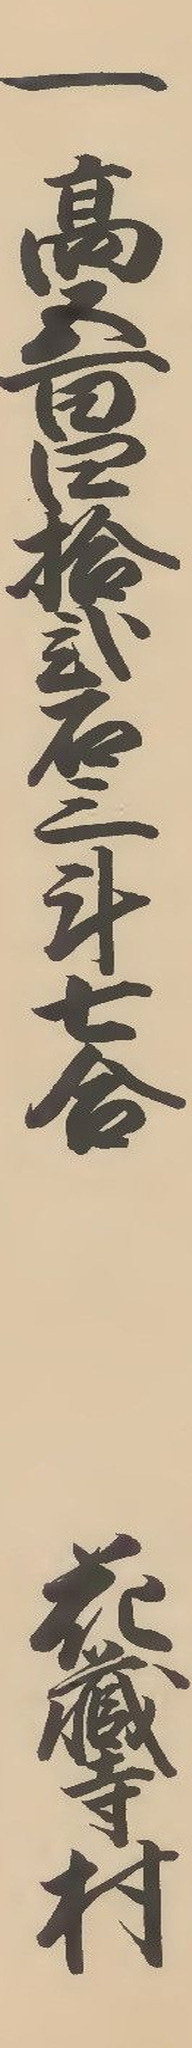一高五百四拾弐石三斗七合花蔵寺村
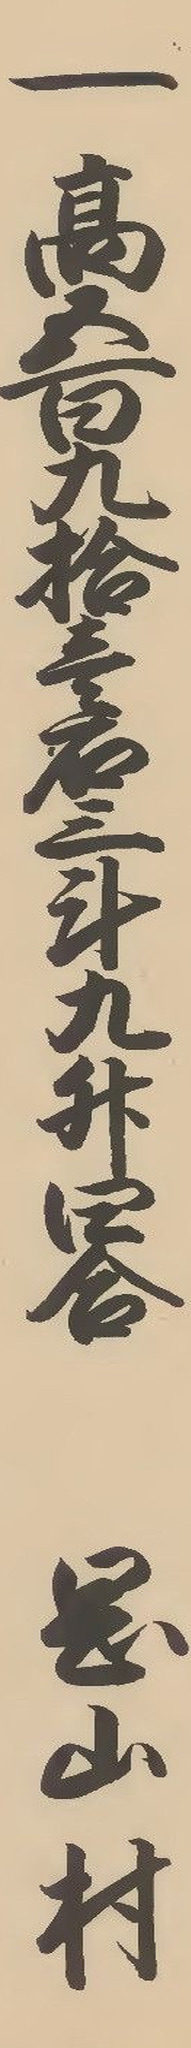一高五百九拾壱石三斗九升四合岡山村
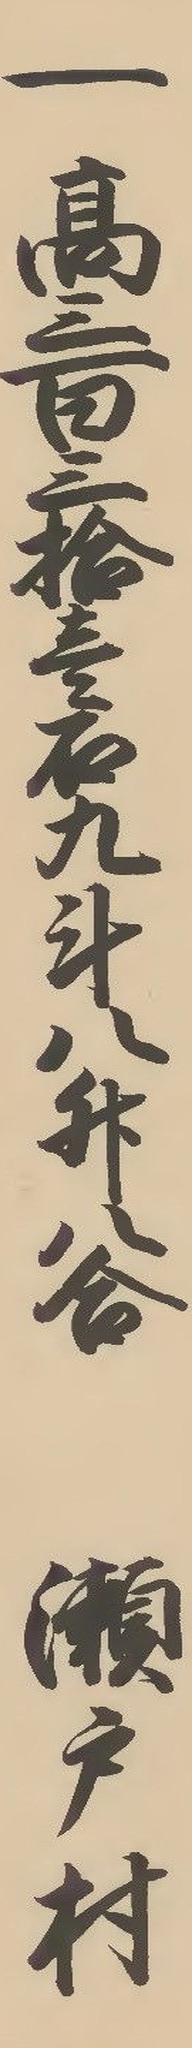一高三百三拾壱石九斗八升八合瀬戸村

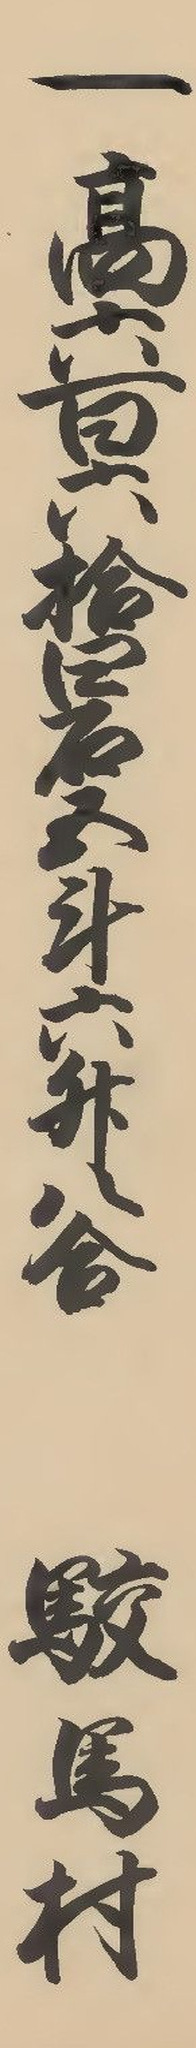一高六百六拾四石五斗六升八合駮馬村
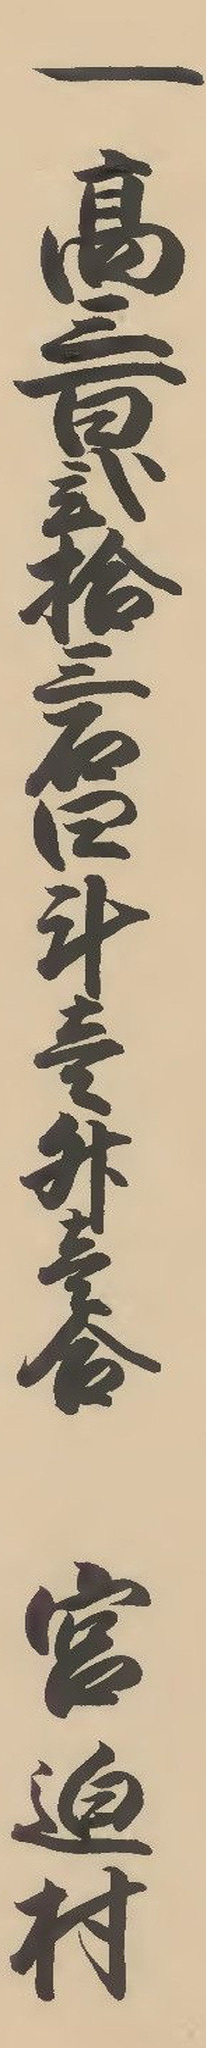一高三百弐拾三石四斗壱升壱合宮迫村
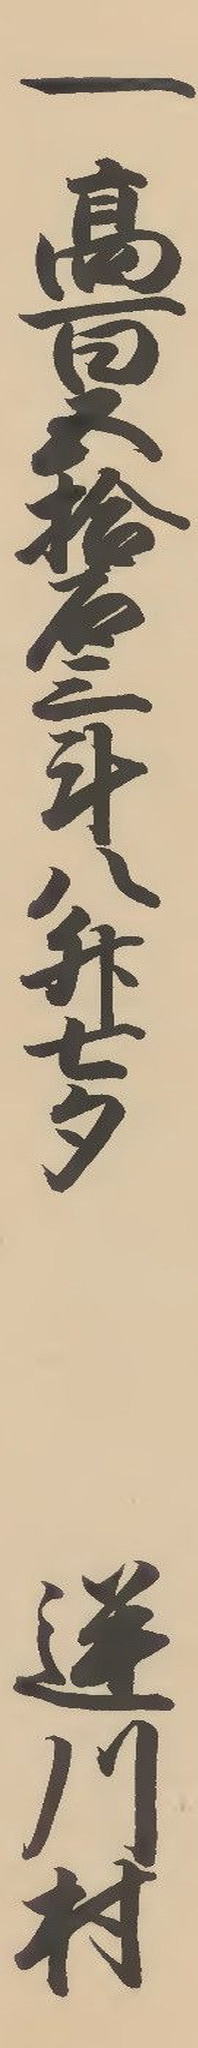一高百五拾石三斗八升七勺逆川村
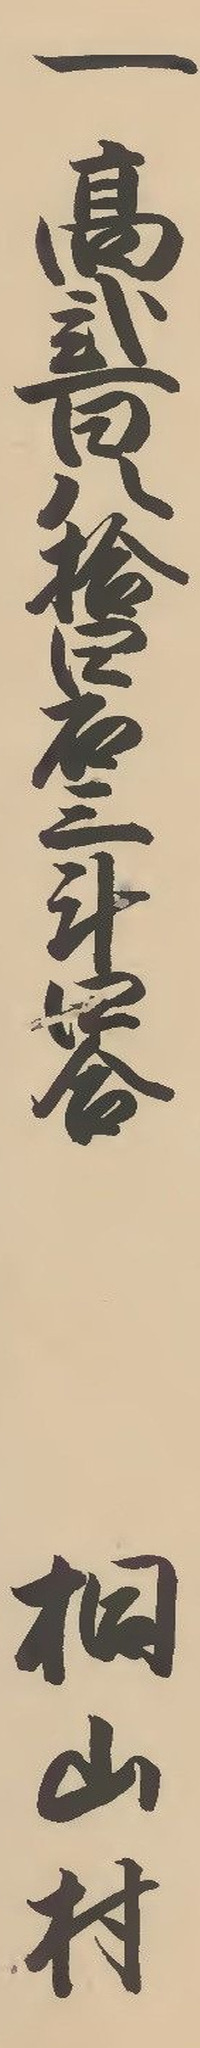一高弐百八拾四石三斗四合桐山村
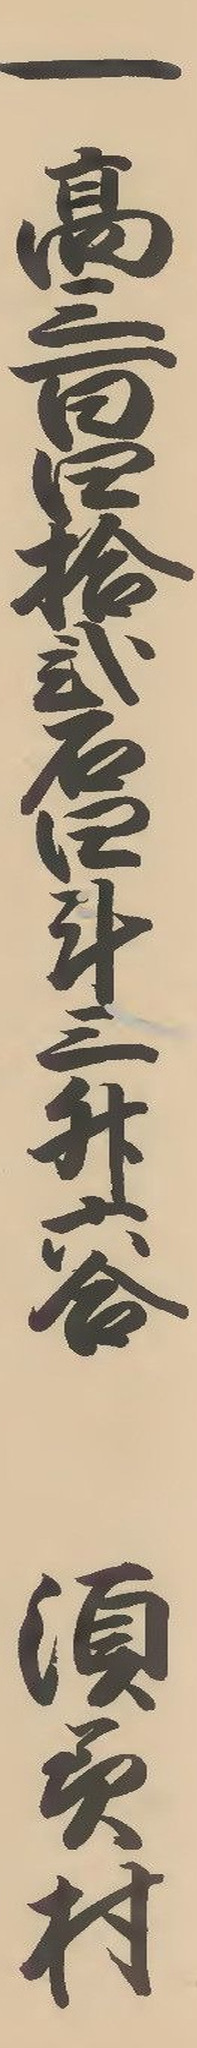一高三百四拾弐石四斗三升六合須美村
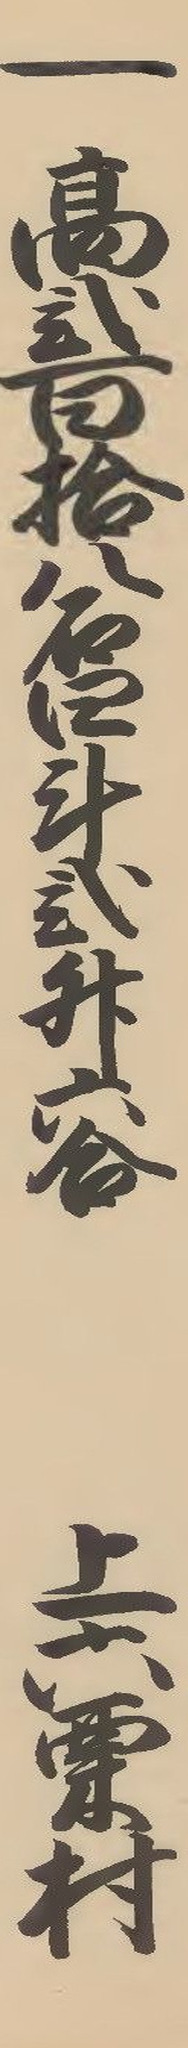一高弐百拾八石四斗弐升六合上六栗村
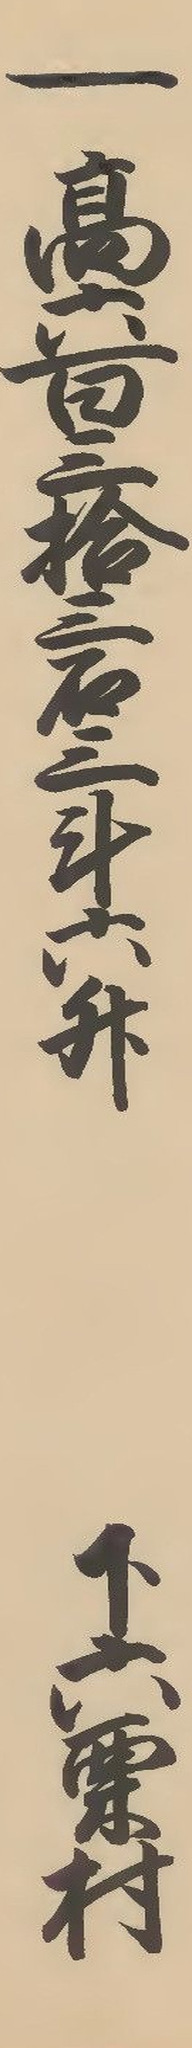一高六百三拾三石三斗六升下六栗村
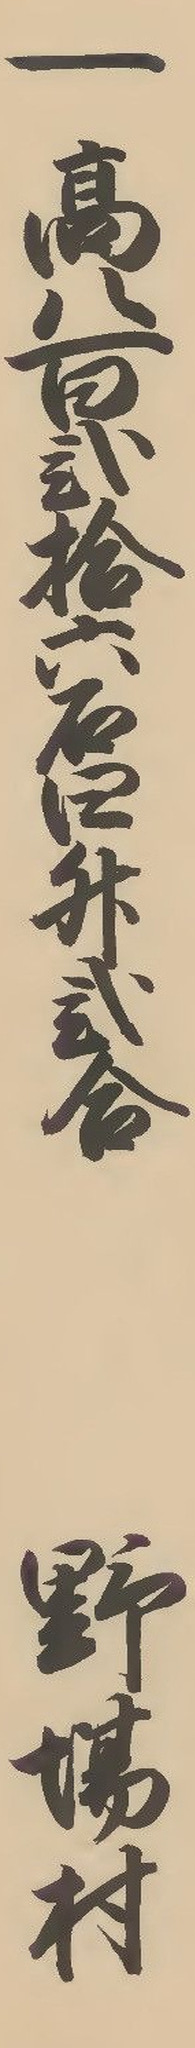一高八百弐拾六石四升弐合野場村

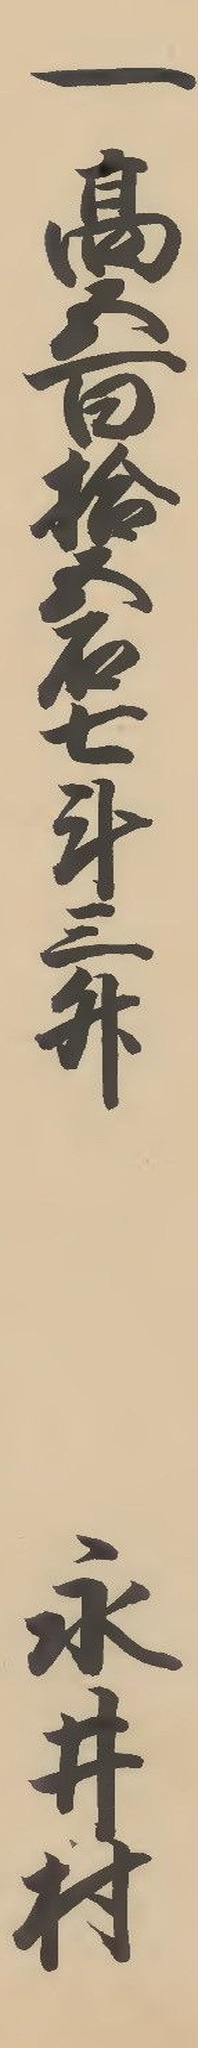一高五百拾五石七斗三升永井村
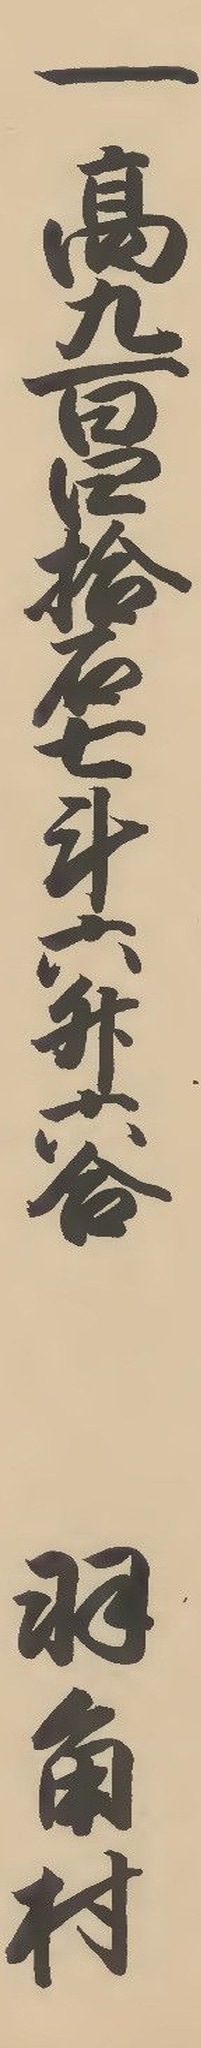一高九百四拾石七斗六升六谷羽角村
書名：三河国郷帳
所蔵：国立公文書館 National Archives of Japan
